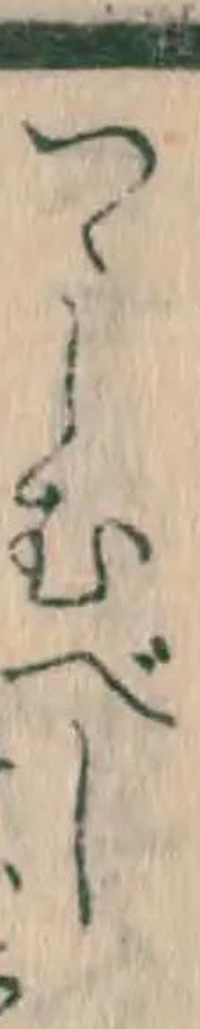つゝしむべし
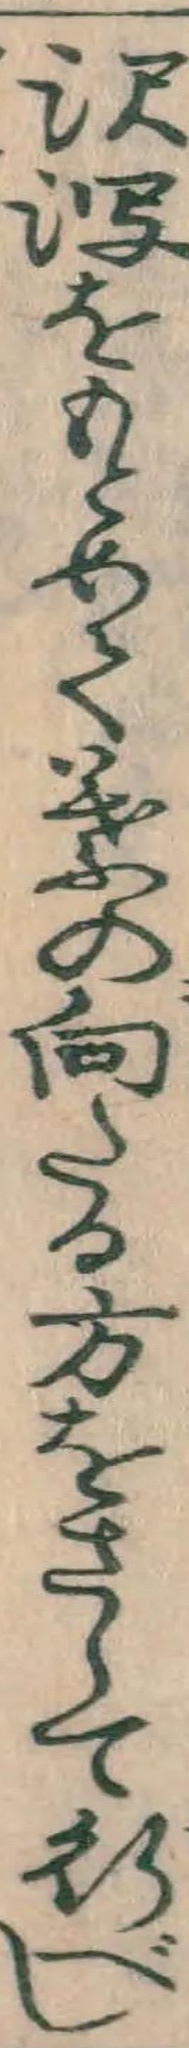沢瀉をもとめて葉の向たる方をさして行べし
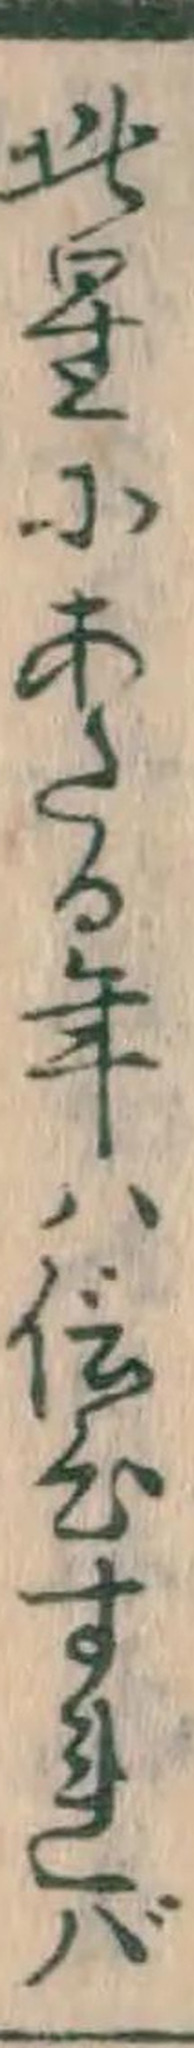此星にあたる年は信心すれば
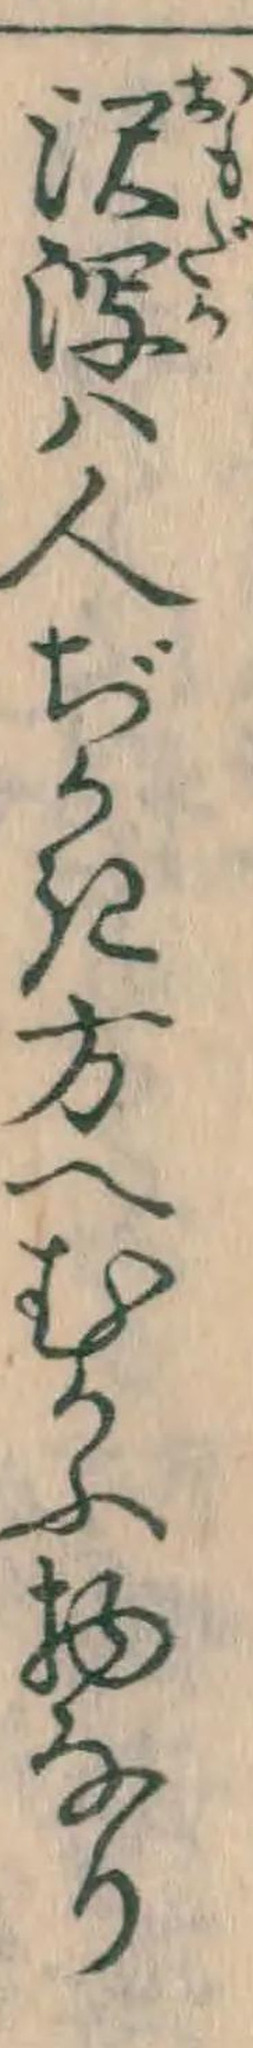沢瀉は人ぢかき方へむかふ物なり
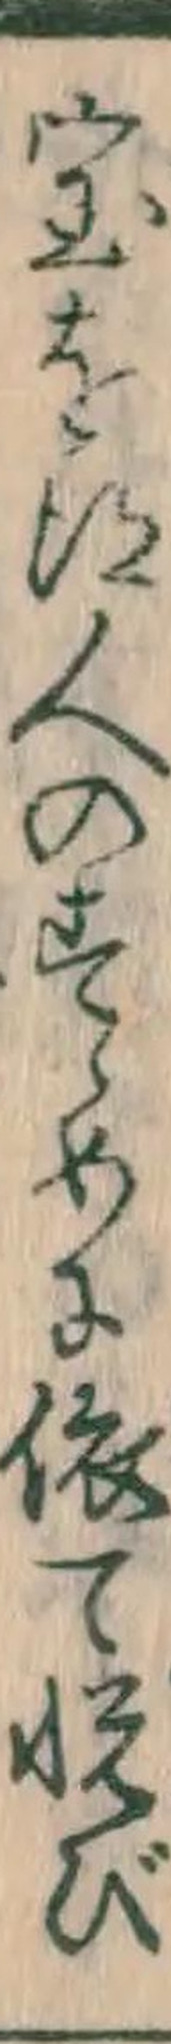宝を得人のすゝめに依て悦び
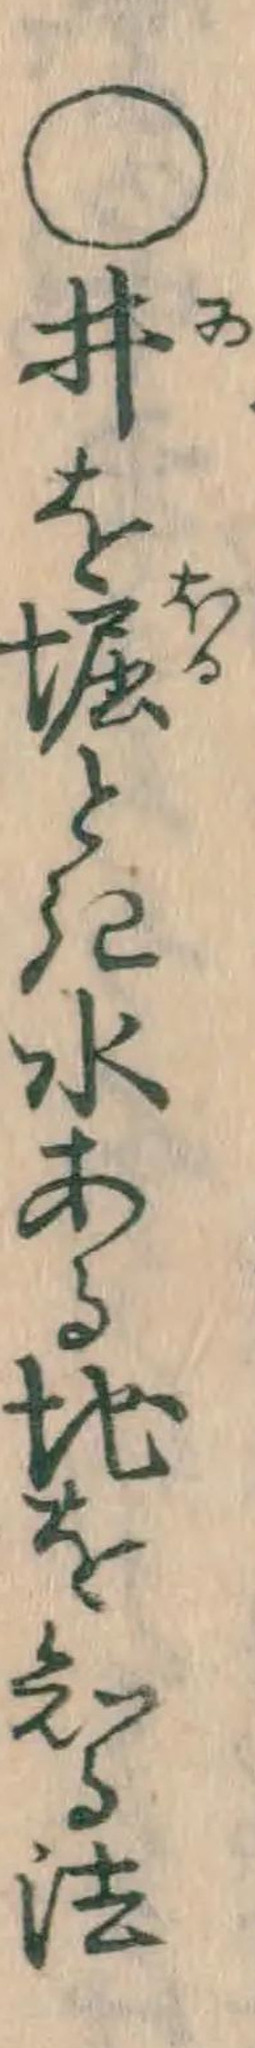○井を掘とき水ある地を知る法
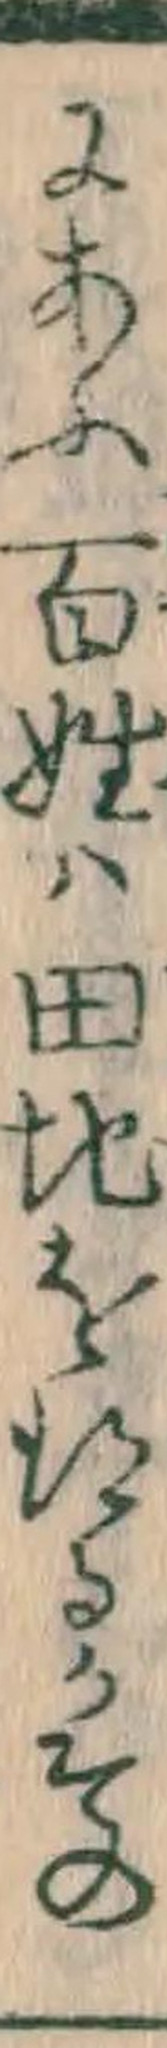にあふ百姓は田地を得るかその
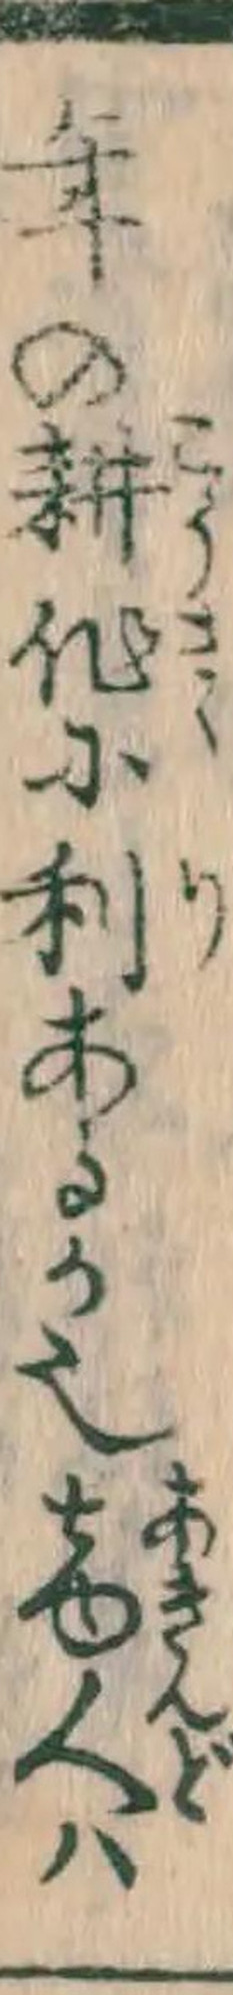年の耕作に利あるか也商人は
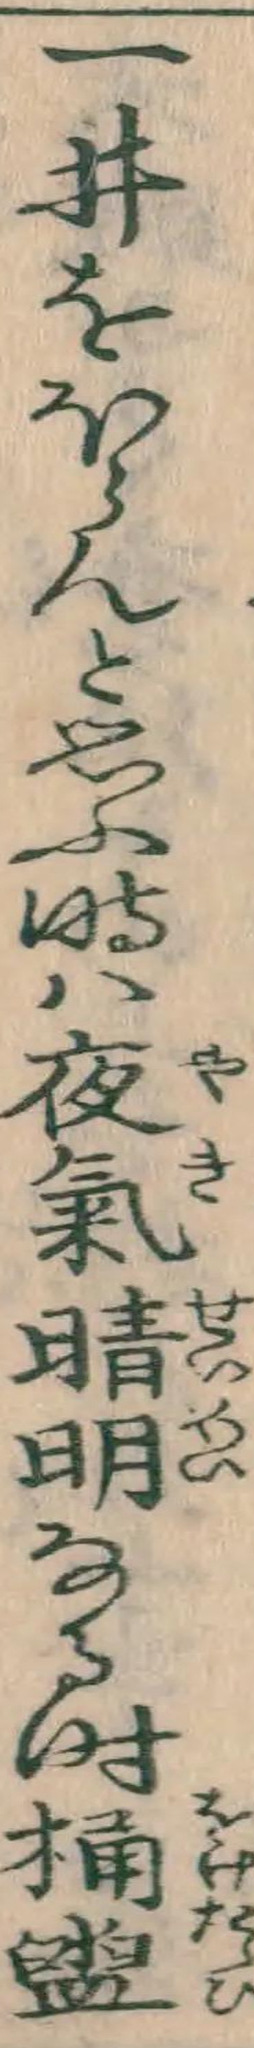一井をほらんと思ふ時は夜気晴明なる時桶盥
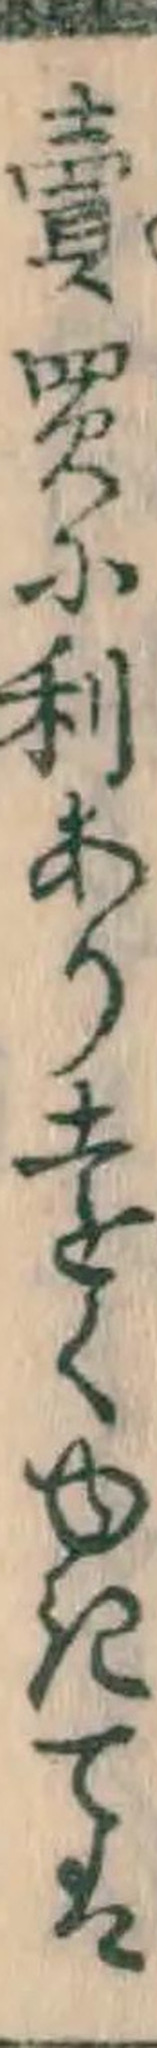売買に利あり遠くゆきては
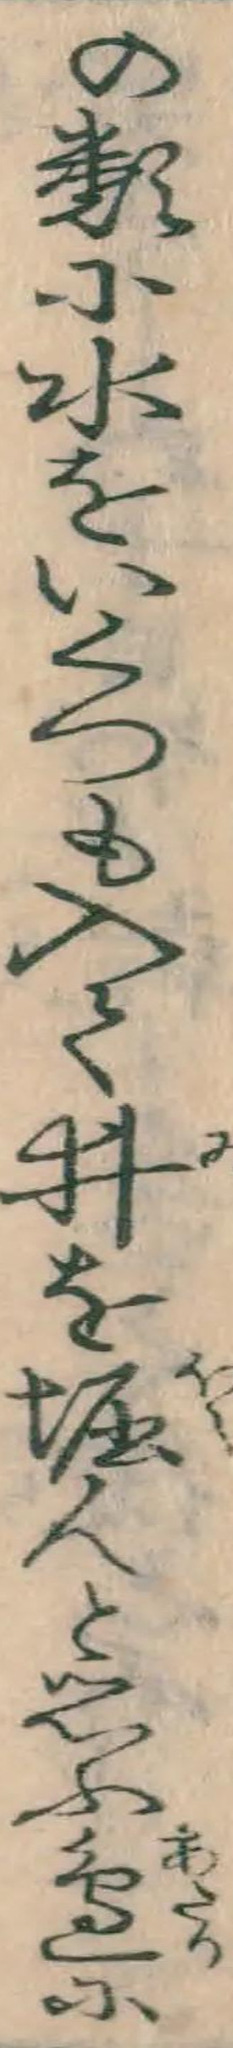の類に水をいくつも入て井を掘んと思ふ辺に
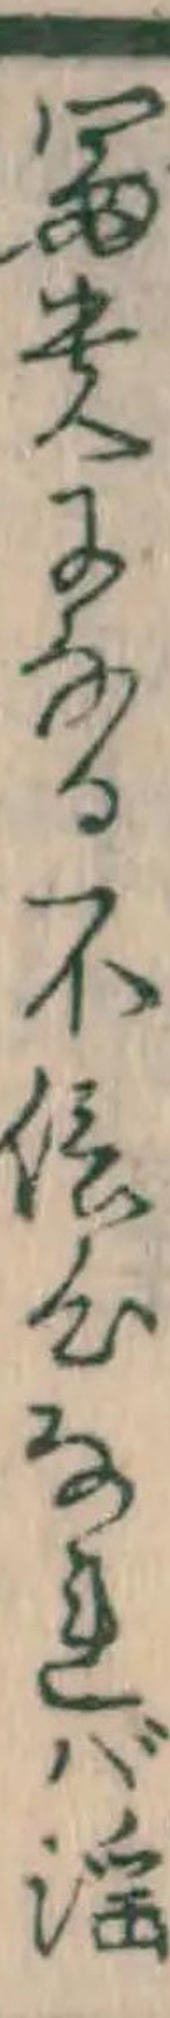富貴になる不信心なれば淫
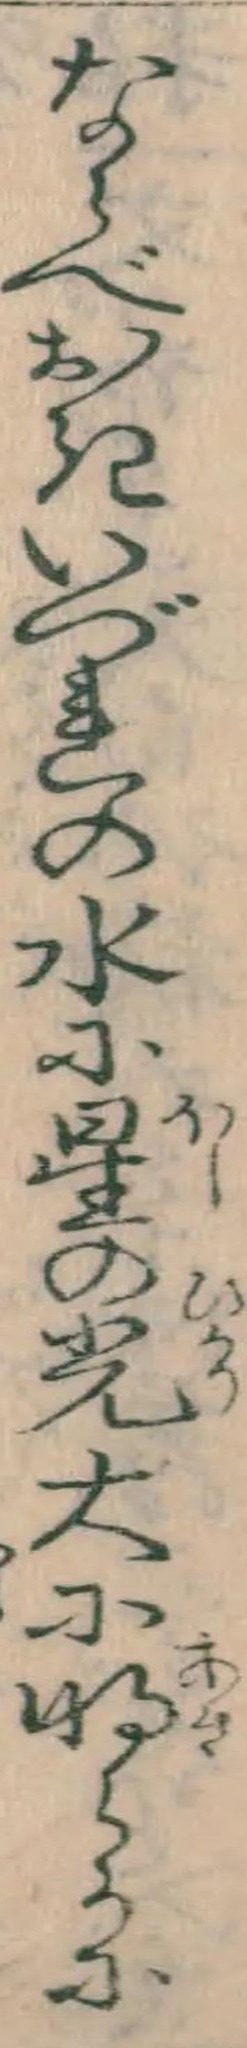ならべおきいづれの水に星の光大に明らかに
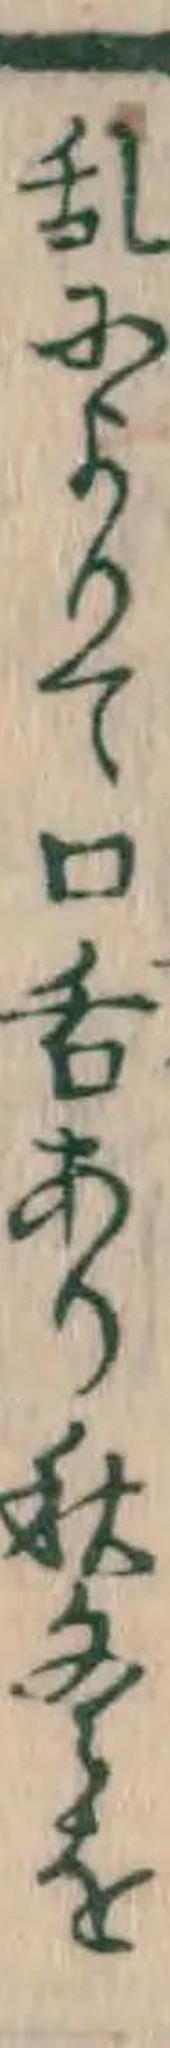乱によりて口舌あり秋冬を
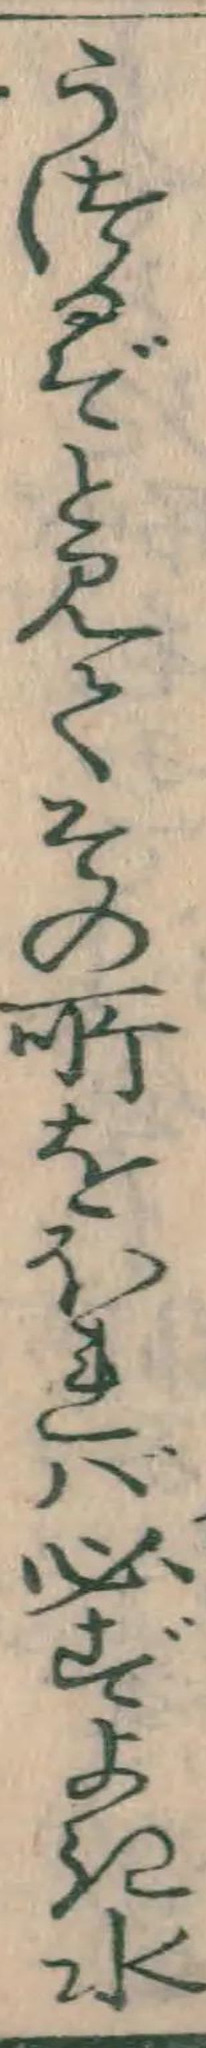うつるぞと見てその所をほれば必ずよき水
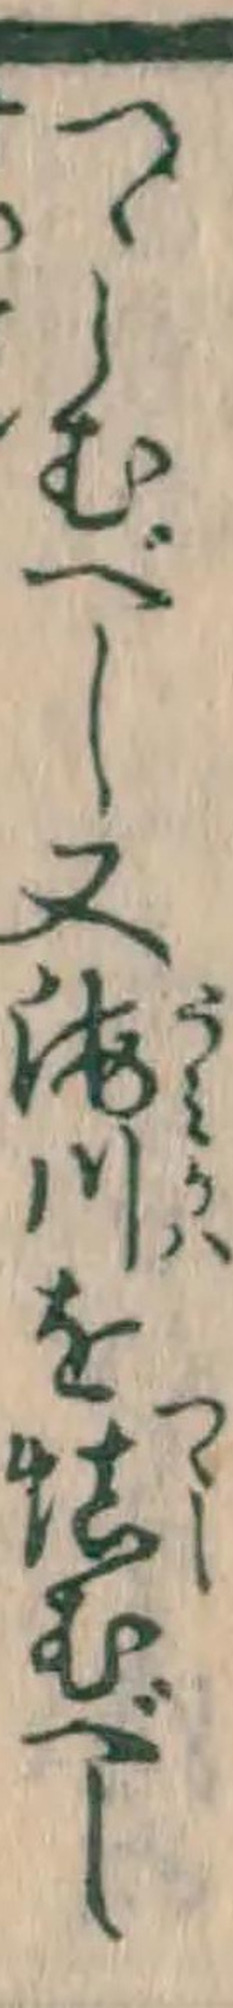つゝしむべし又海川を慎むべし
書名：広益秘事大全 3巻. [1]
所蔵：国立国会図書館 National Diet Library, JAPAN
